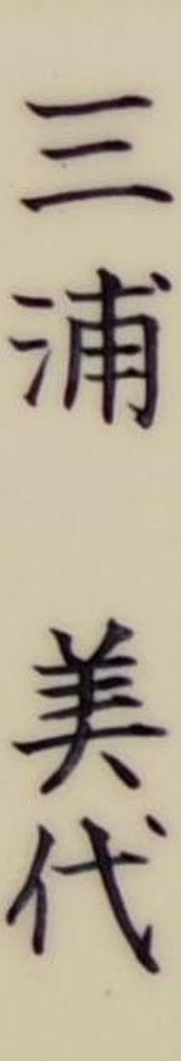三浦美代
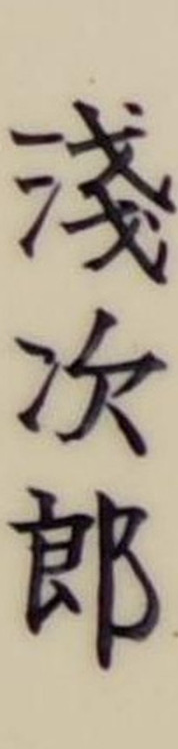浅次郎

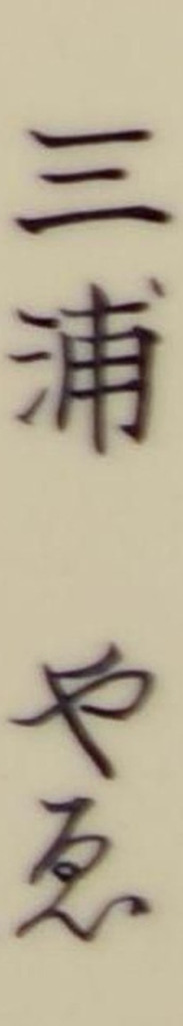三浦やえ
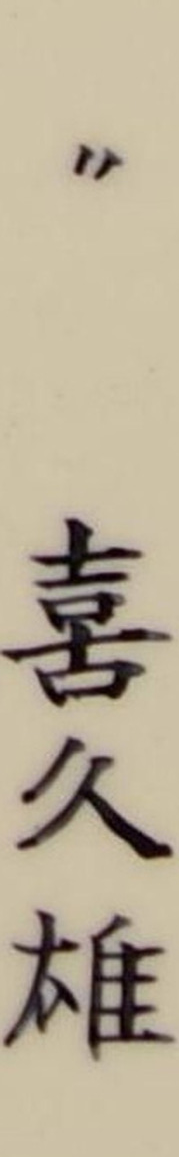喜久雄
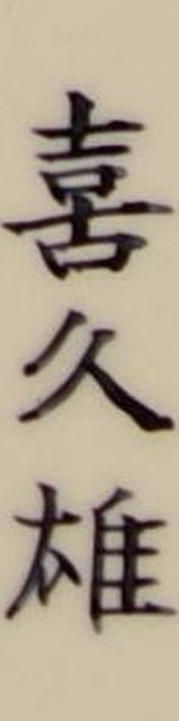喜久雄
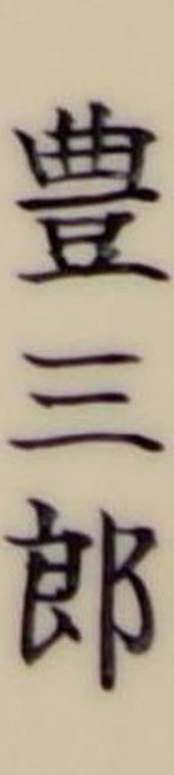豊三郎
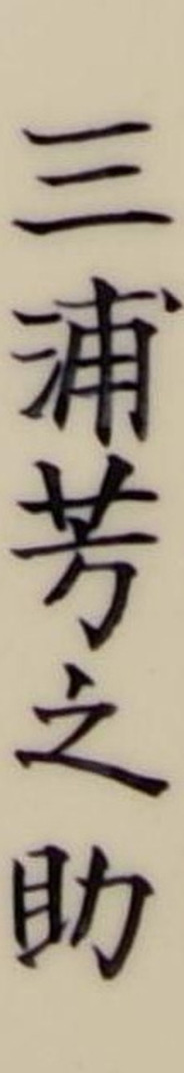三浦芳之助
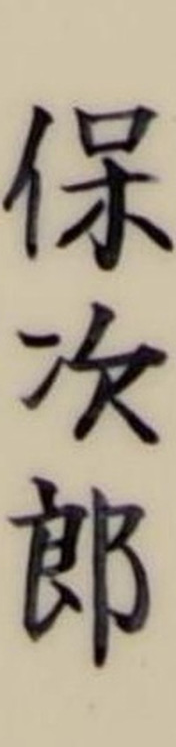保次郎
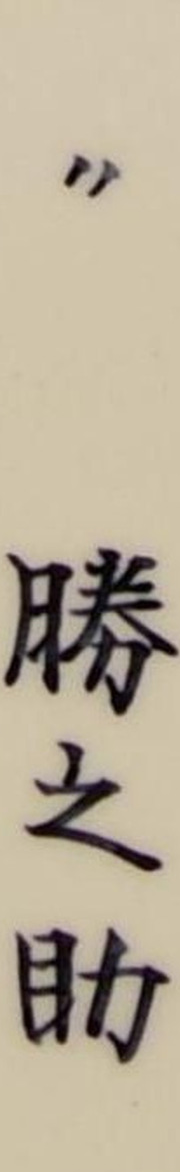勝之助
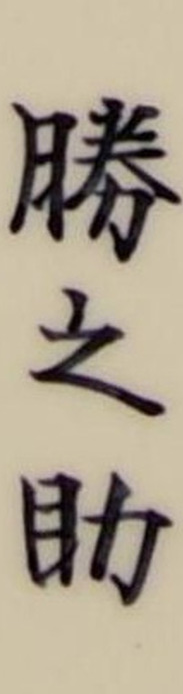勝之助
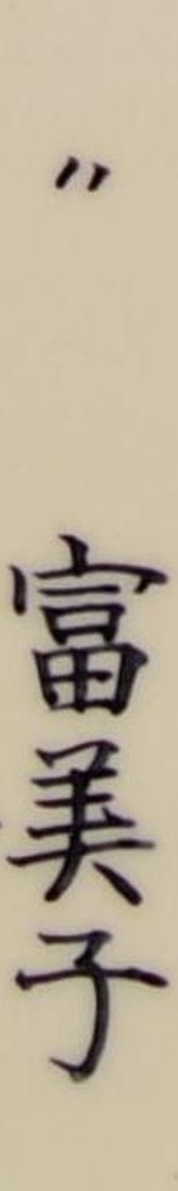富美子
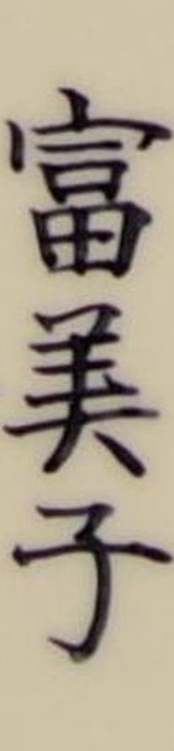富美子
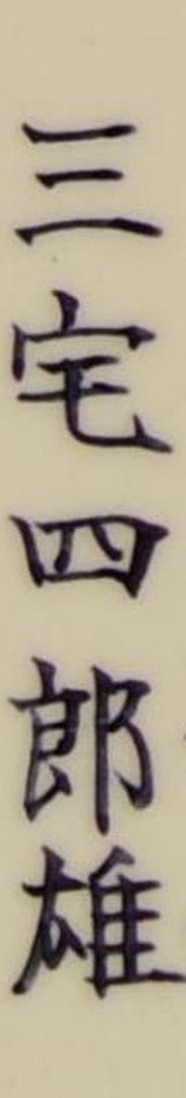三宅四郎雄
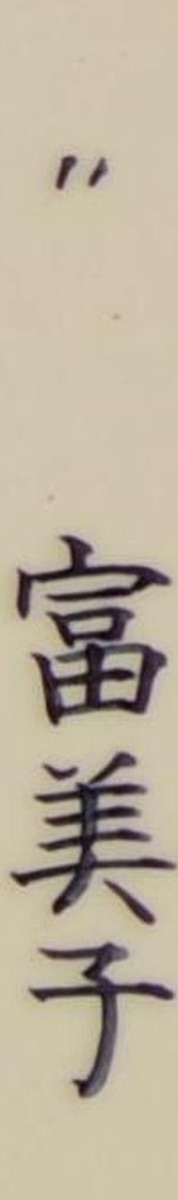富美子
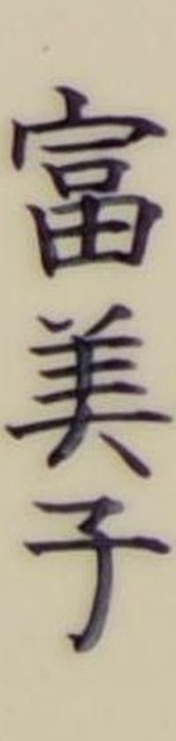富美子

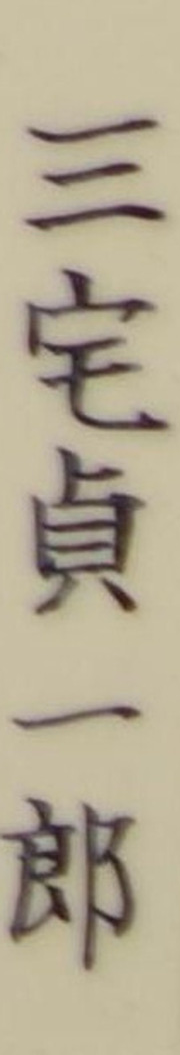三宅貞一郎
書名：E~L
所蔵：高野山金剛峯寺
